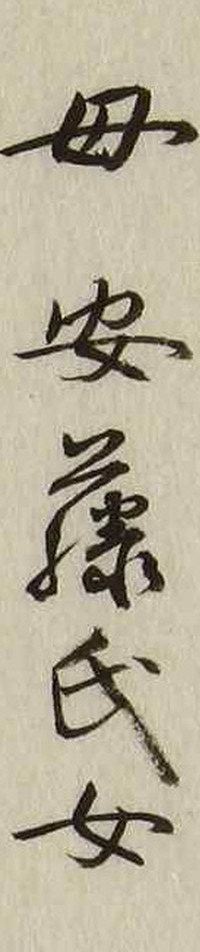母安藤氏女
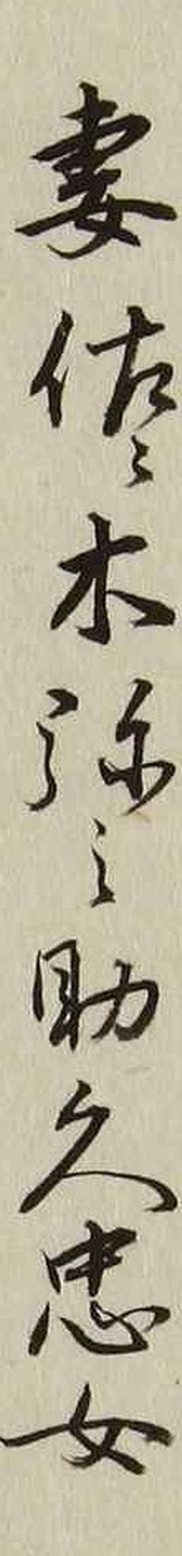妻佐々木弥之助久忠女
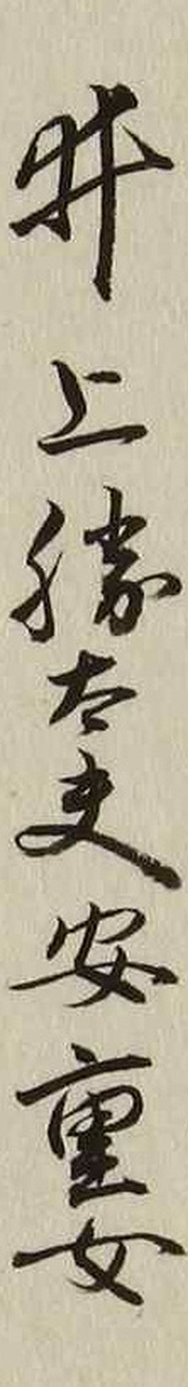井上勝太夫安重女
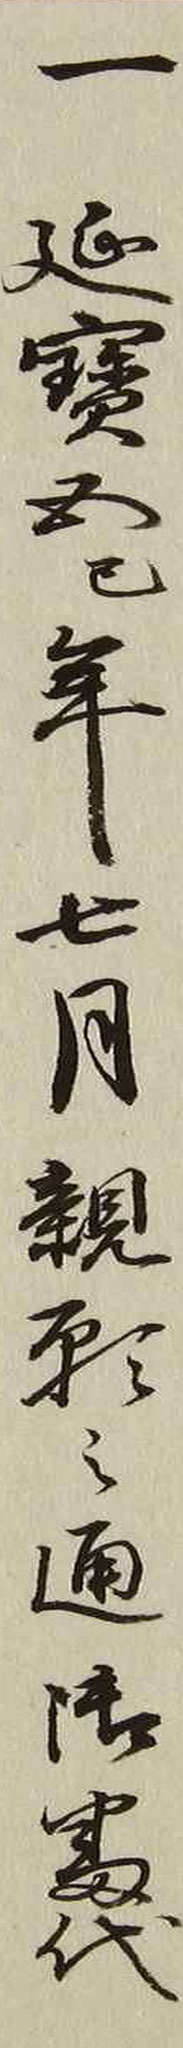一延宝五巳年七月親願之通御番代
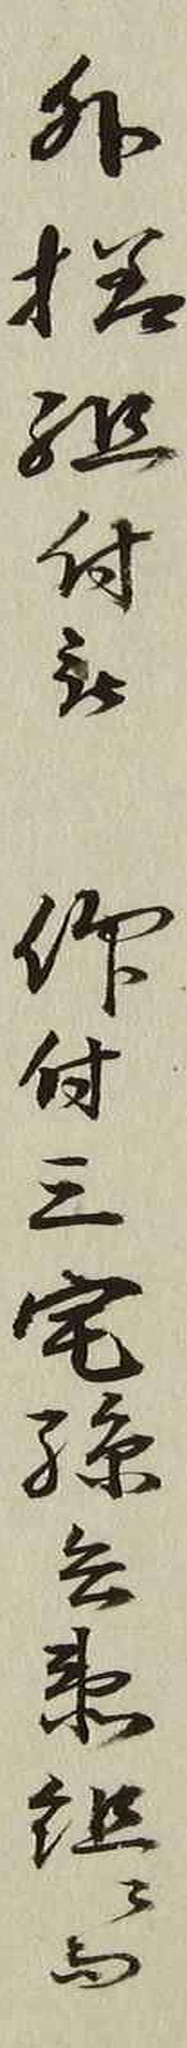外様組付被仰付三宅孫兵衛組ニ而
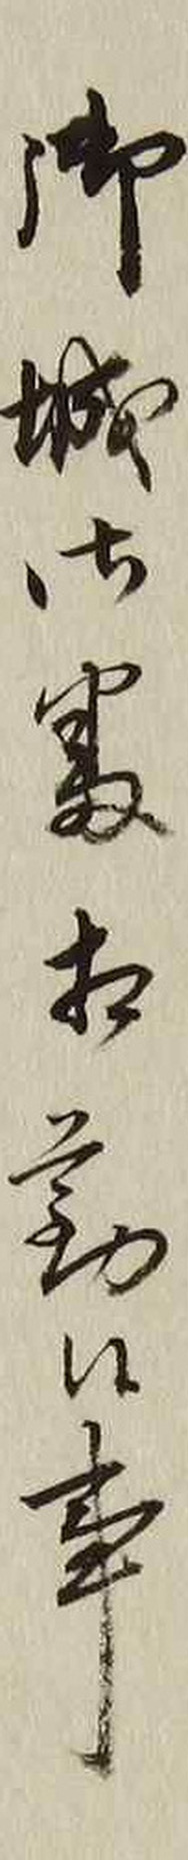御城御番相勤候事
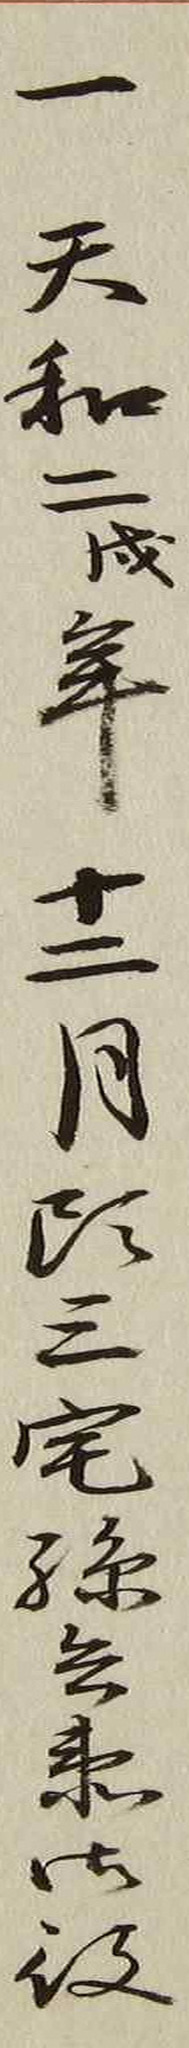一天和二戌年十二月頭三宅孫兵衛御役
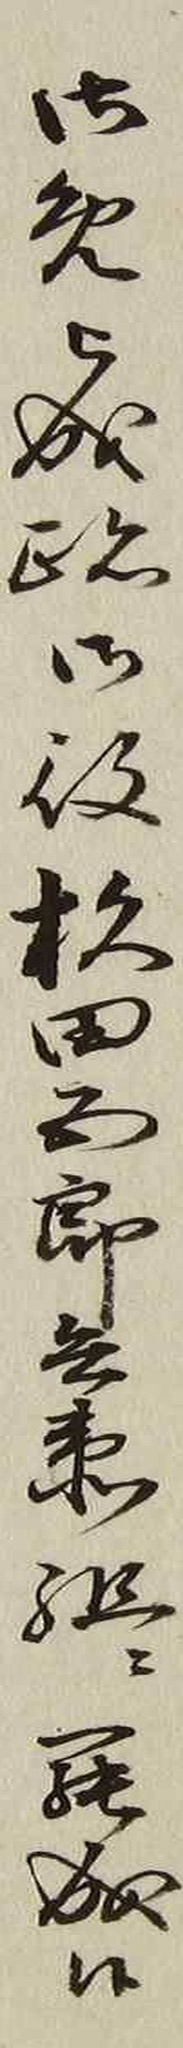御免被成跡御役杉田五郎兵衛組ニ罷成候
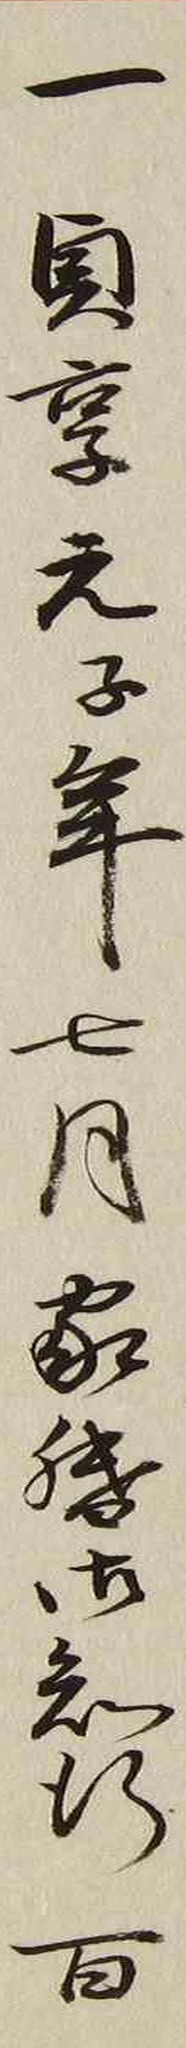一貞享元子年七月家督御知行百
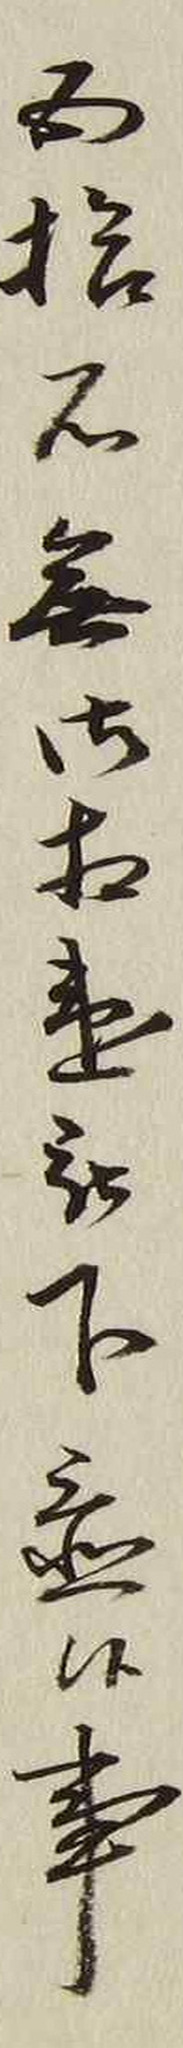五拾石無御相違被下置候事
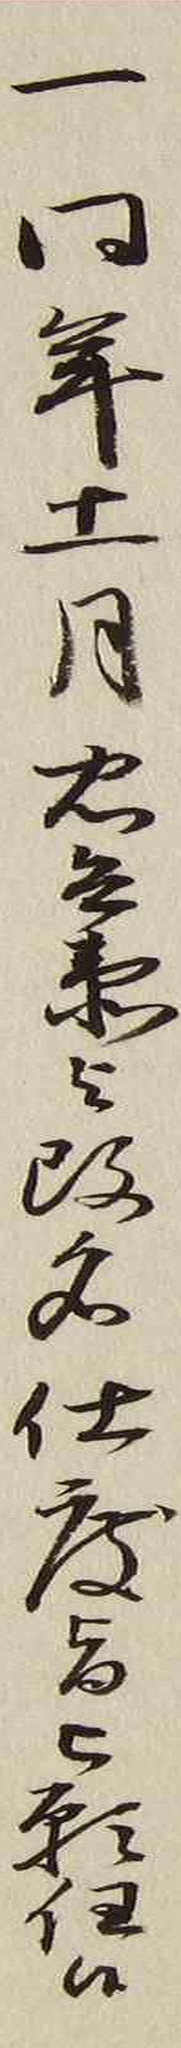一同年十一月忠兵衛と改名仕度旨被願任候
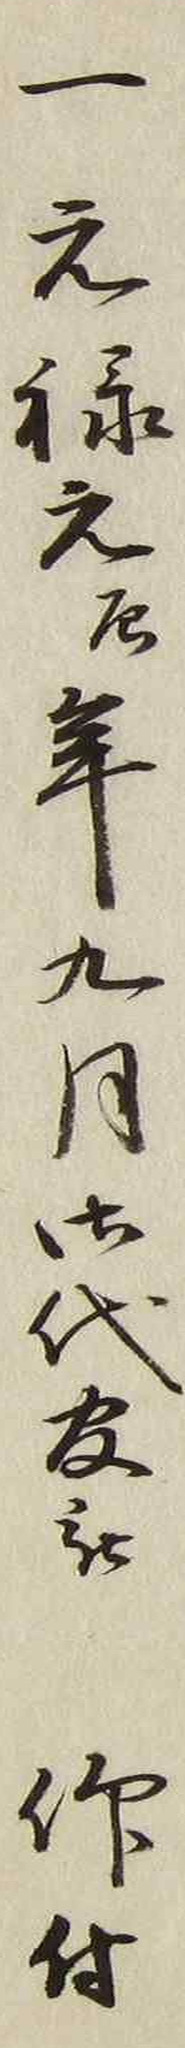一元禄元辰年九月御代官被仰付

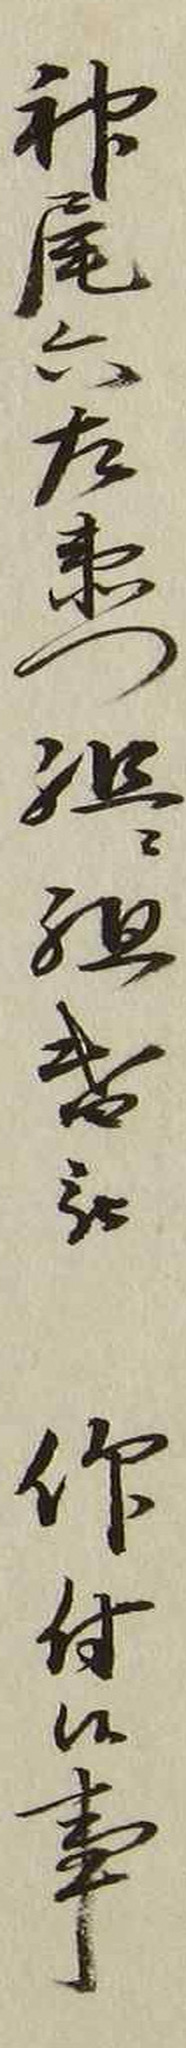神尾六左衛門組ニ組替被仰付候事
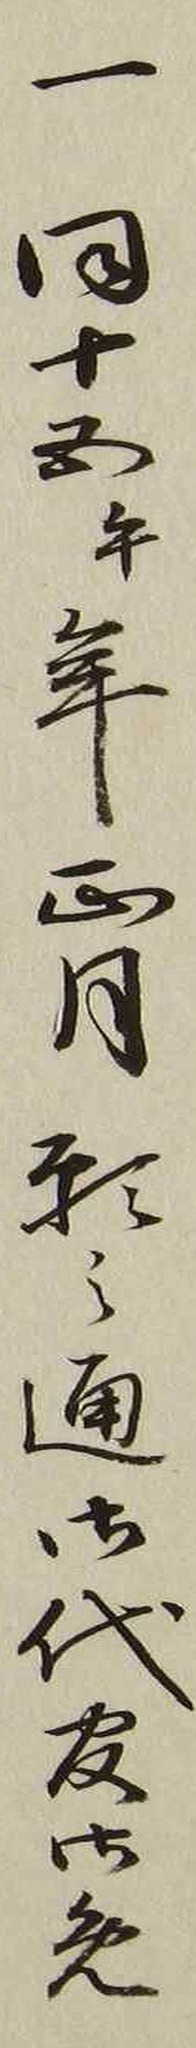一同十五午年正月願之通御代官御免
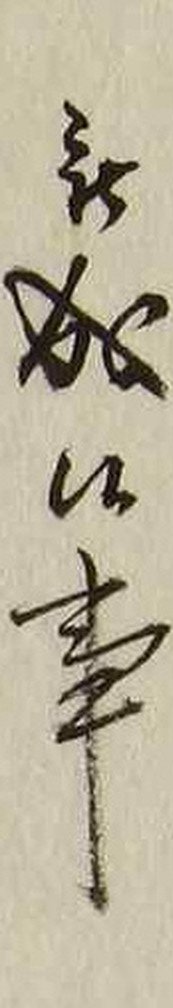被成候事
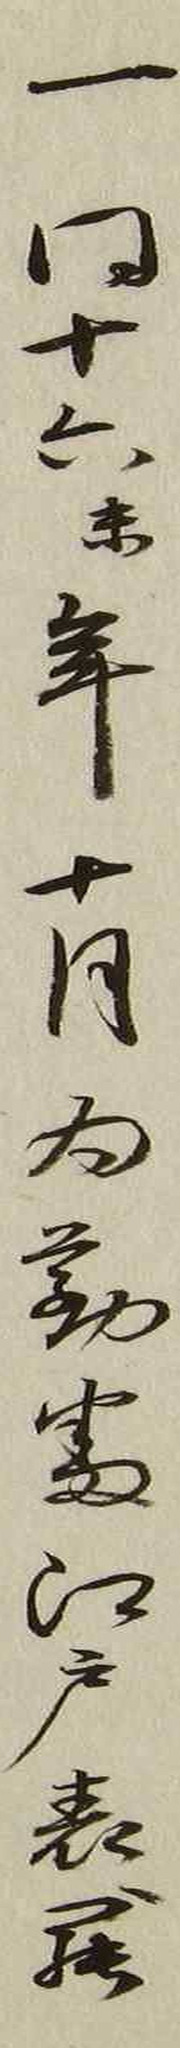一同十六未年十月為勤番江戸へ罷
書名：諸士系譜　巻之160　な之部2
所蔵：会津若松市立会津図書館
